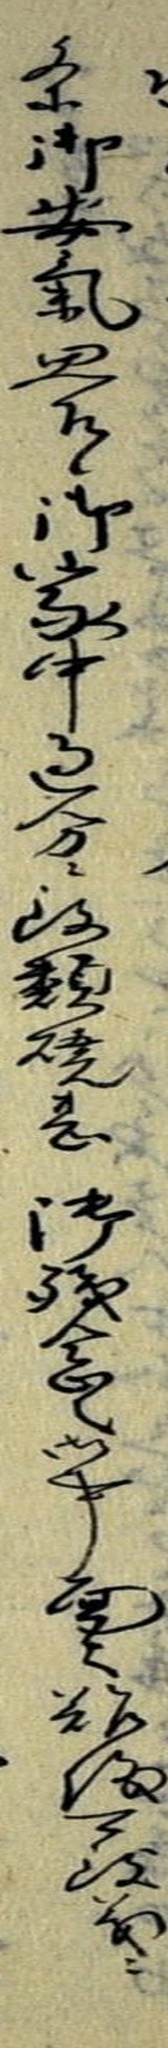条御安気思召候御家中過分に致類焼甚御残念之御事面々難儀可致義に
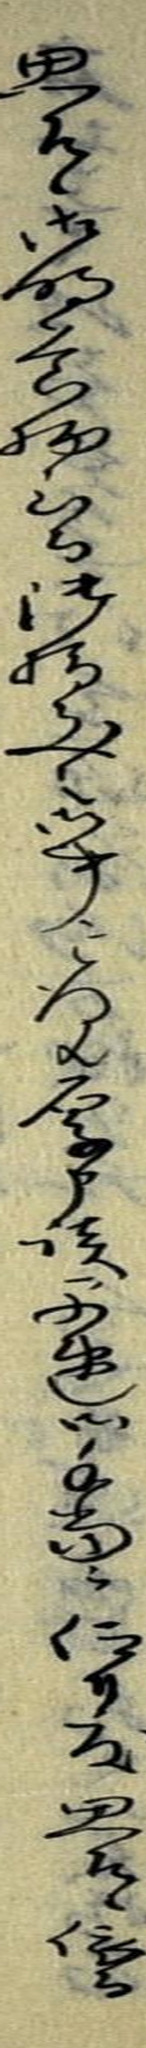思召候御時節柄至而御指支之御事に候得共厚申談早速御手当被仰付度思召候依而
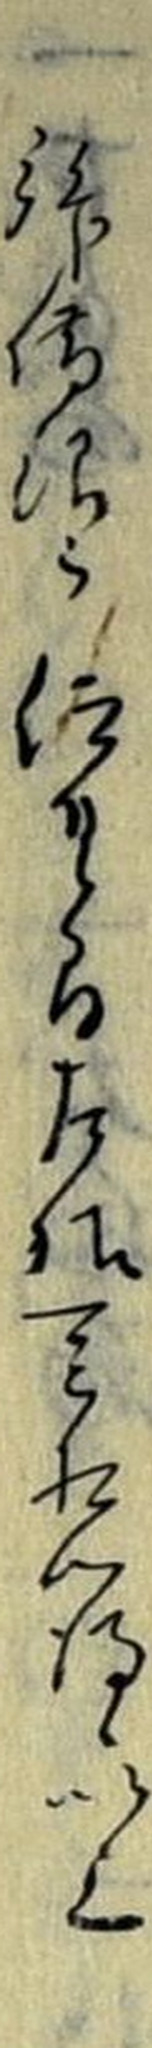拝借銀被仰付候間左様可被相心得候以上
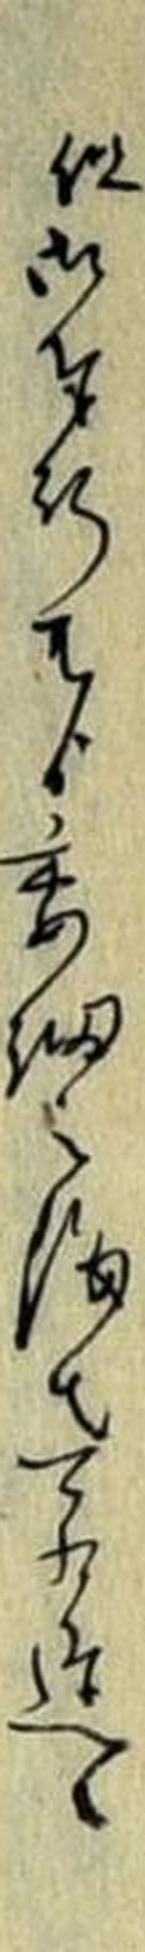但御奉行共ゟ委細之儀は可相達候
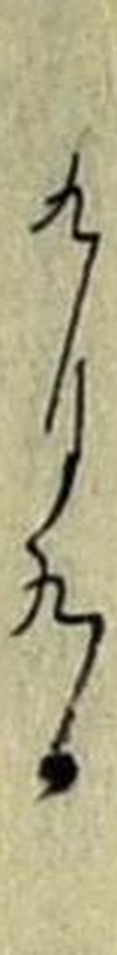九月九日
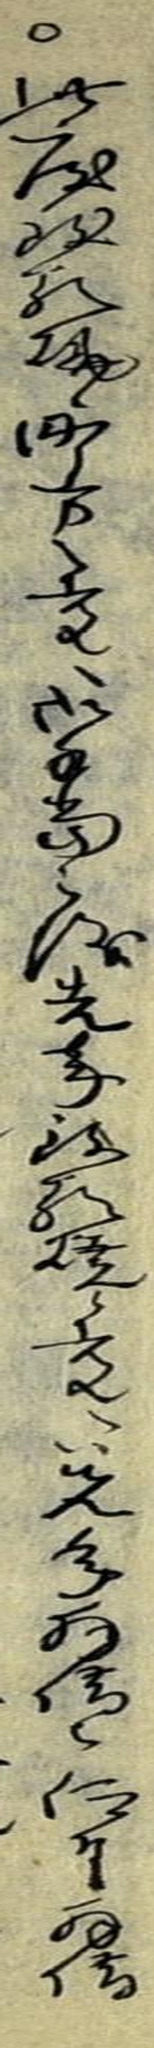〇此度致類焼候町方之者共へ御手当之儀先年致類焼候者へは先年拝借被仰付候拝借
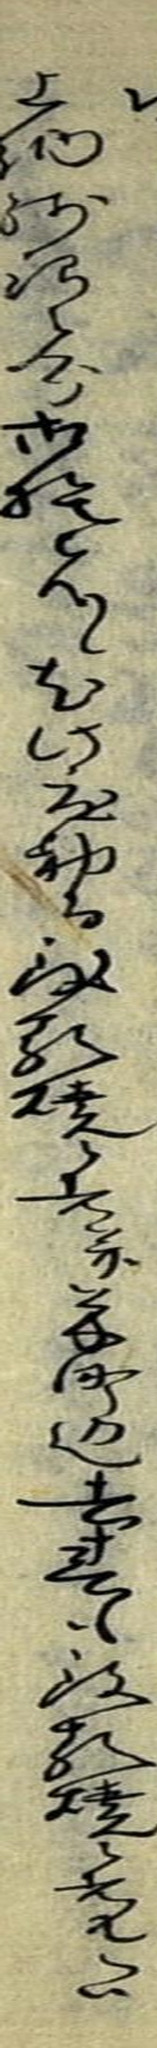上納残銀之分御捨被下候尤此度初而致類焼候者并米町辺去春も致類焼候者共へは
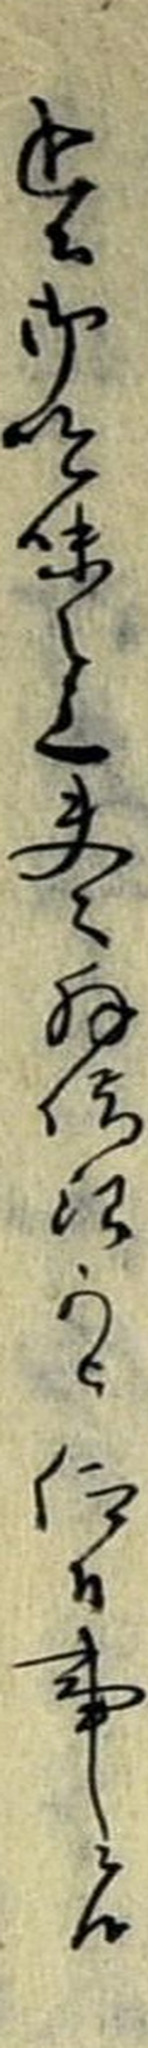追々御吟味之上夫々拝借銀可被仰付事に候
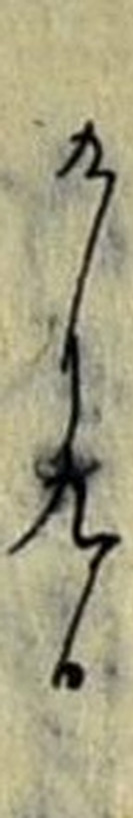九月九日

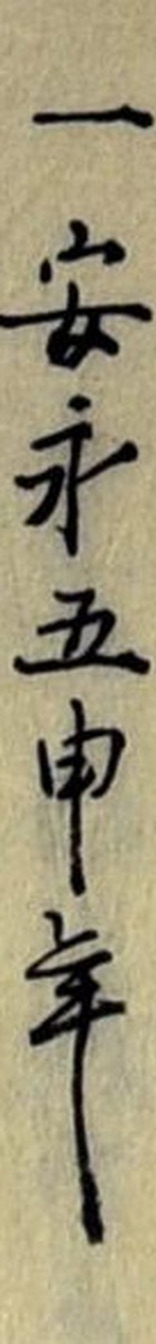一安永五申年
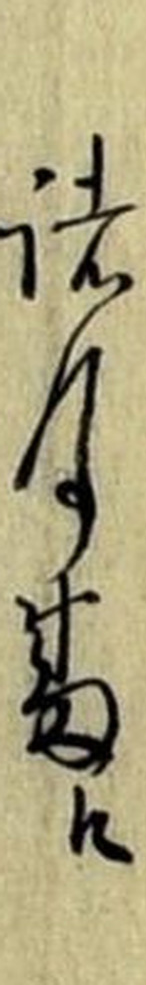諸月番へ
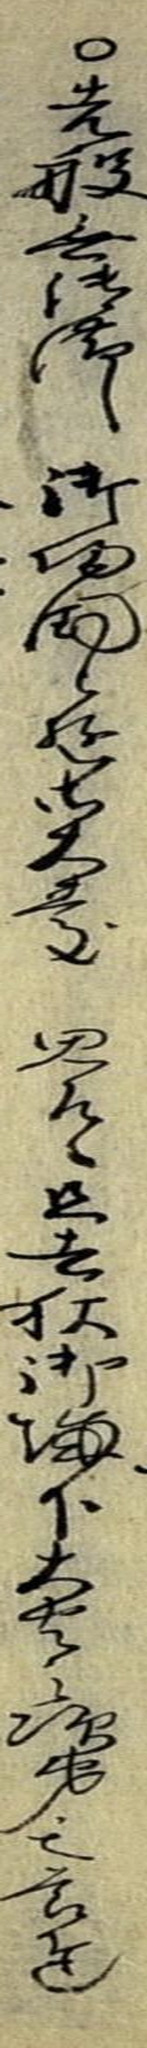〇先般無御滞御帰国被遊御大慶思召候且去秋御城下大火之次第其節達
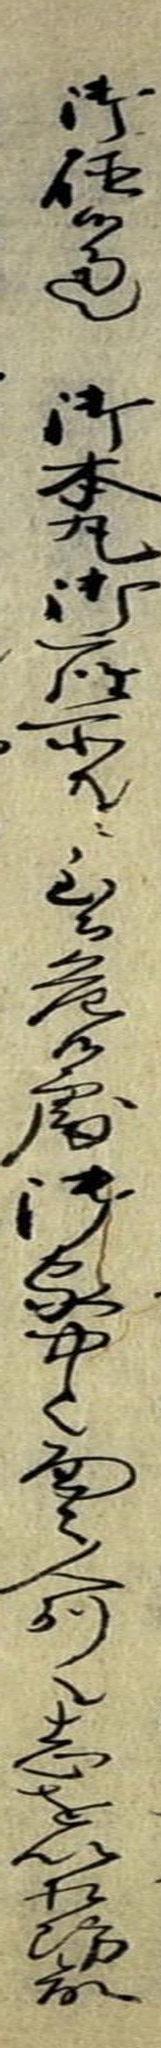御聴候通御本丸御座所共に至而危候処御家中之面々人別之志を以相防候故
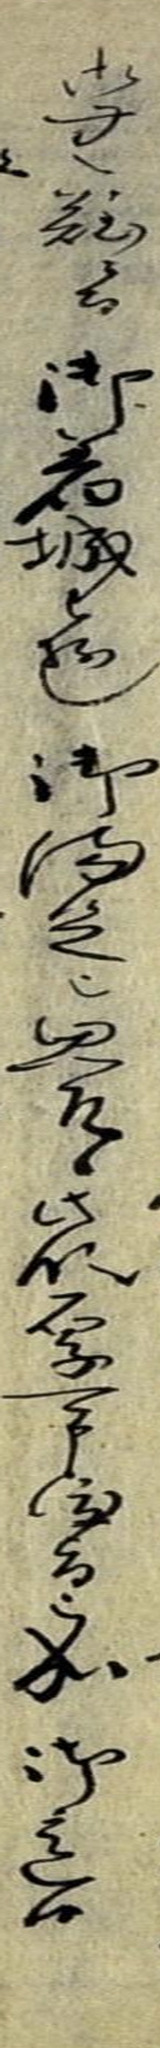御無難に而御着城被遊御満足被思召候此段厚可申渡旨被成御意候
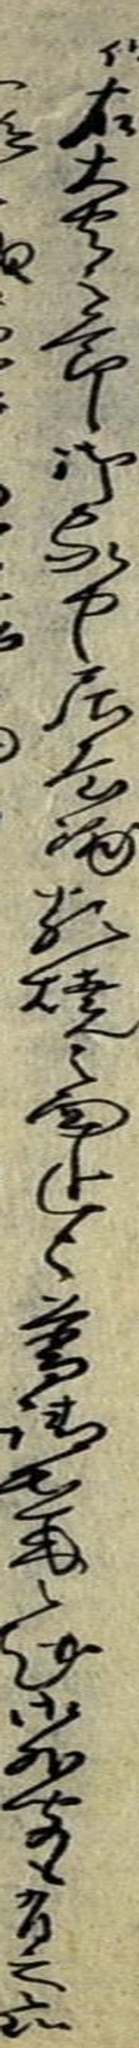但右大火之節御家中居屋鋪類焼之面追々普請出来之趣御外聞も有之候処
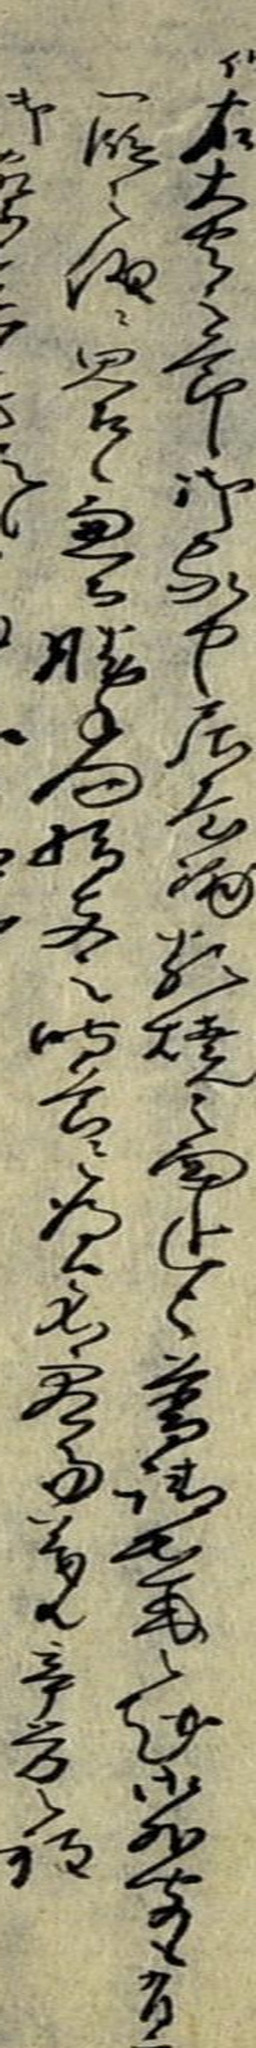一段之儀に思召候兼而勝手向指支之時節に候得は不容易義共辛労之程
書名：命令之部 二
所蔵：福井県文書館 Fukui Prefectural Archives
